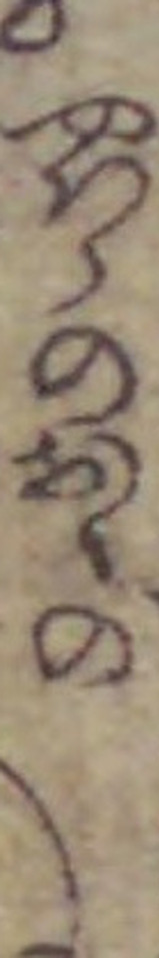やはらのおくの
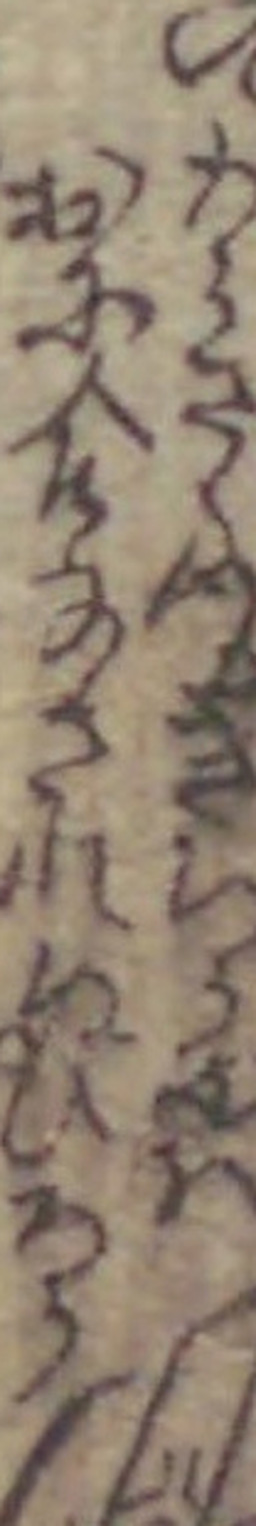おに合なされぬひろう
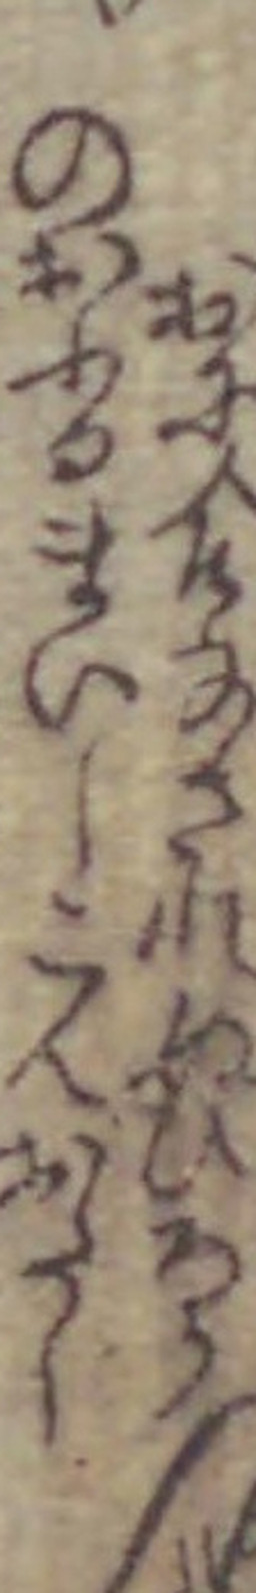のおふるまいしこんおたし
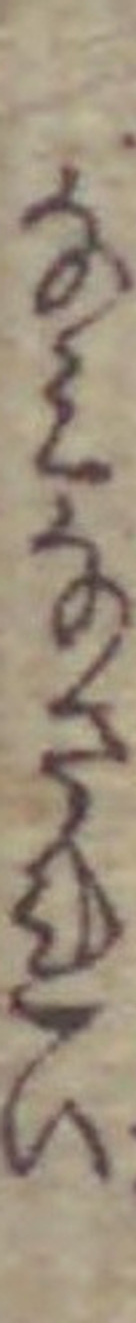なみなされい
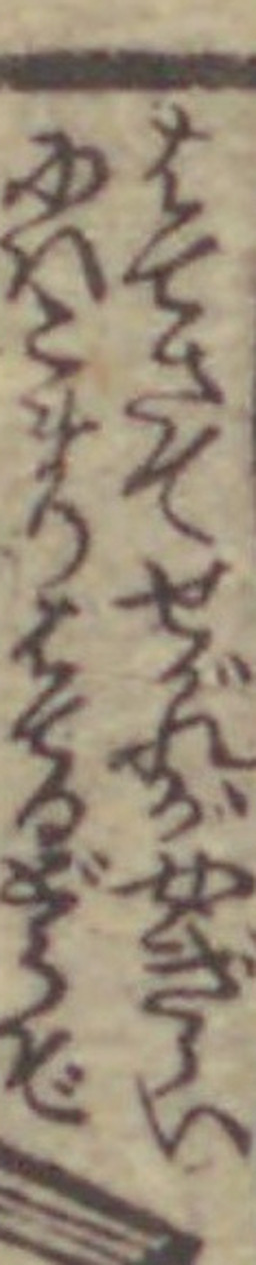にはこまりはてるどうぞ
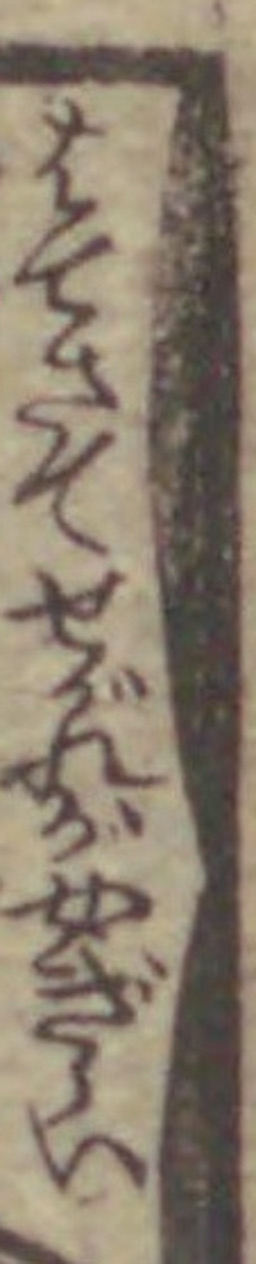はてさてせがれか女ぎらい
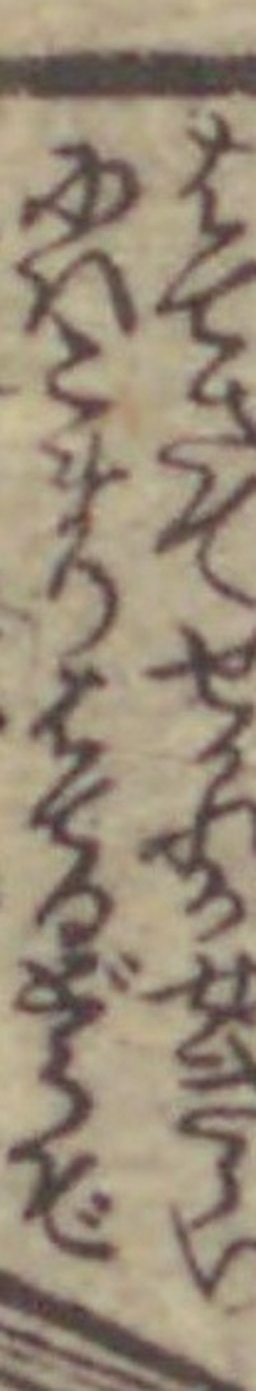にはこまりはてるどうぞ
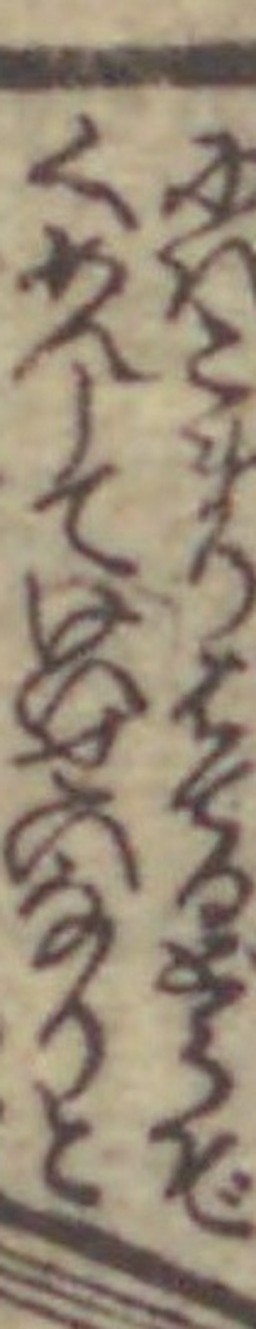くめんしてけいせいなりと
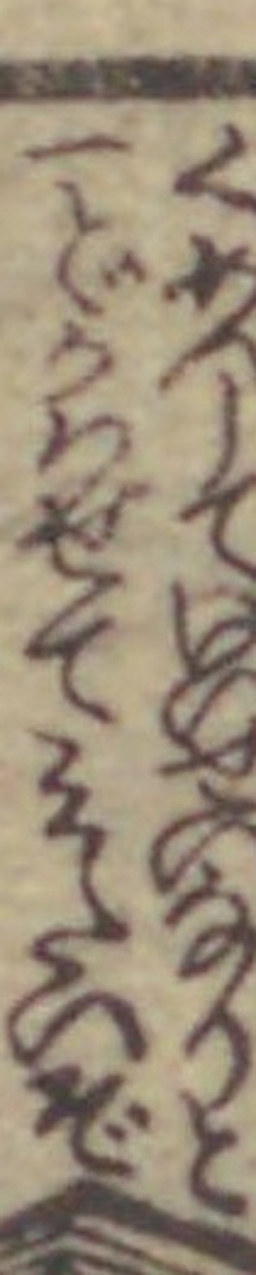一どかはせてみたいぞ
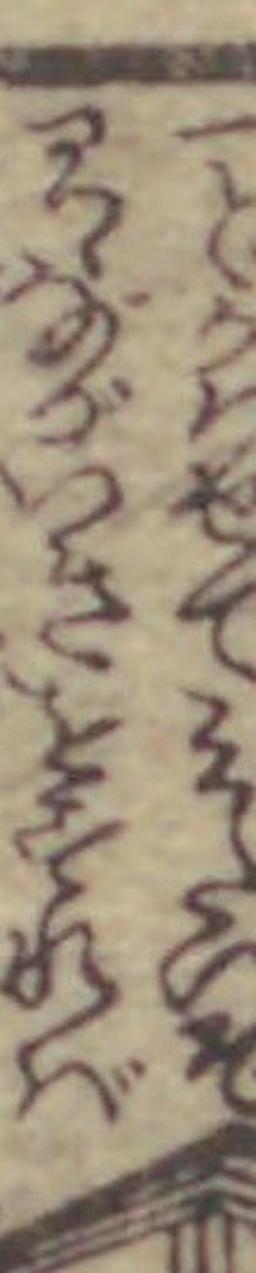マア？ながいきをすれば
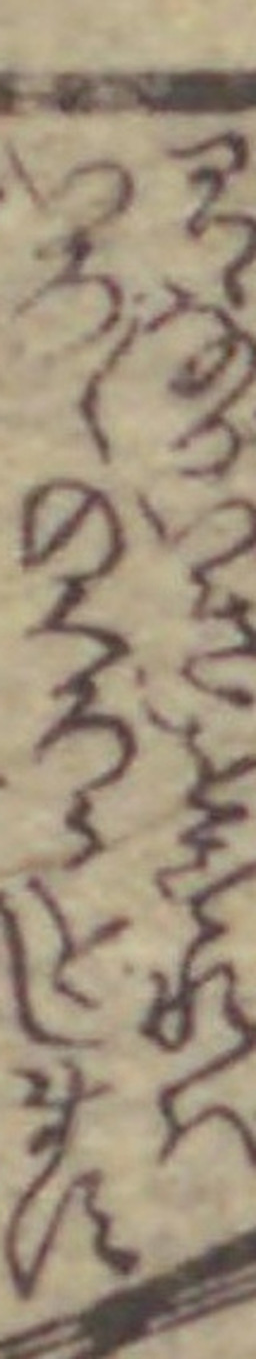いろ〳〵のくろうをします
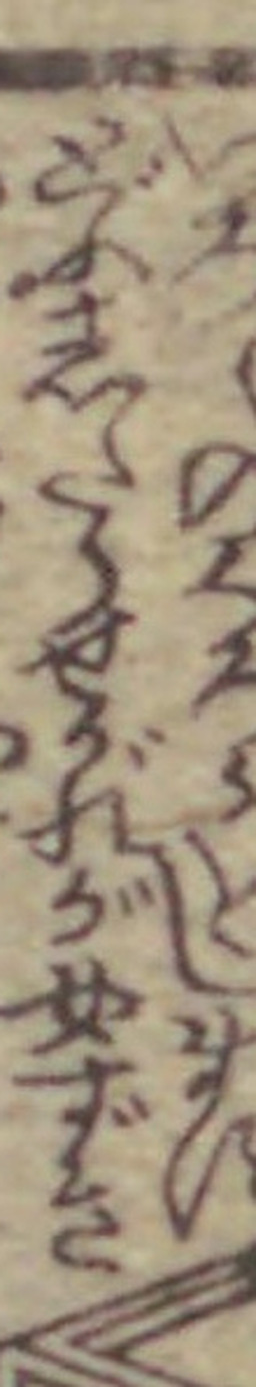どうしたらせがれが女ずき
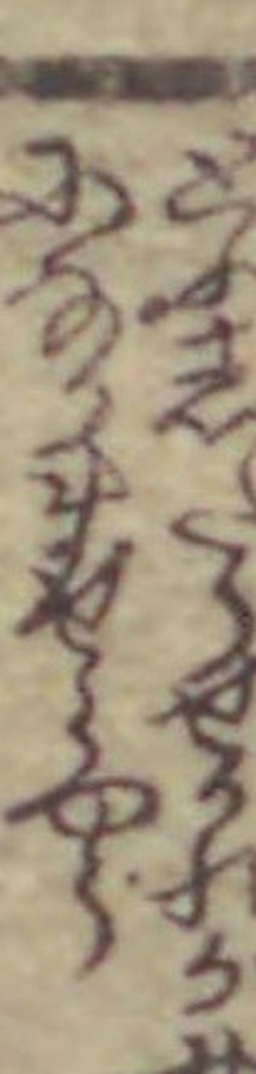になりませうやら
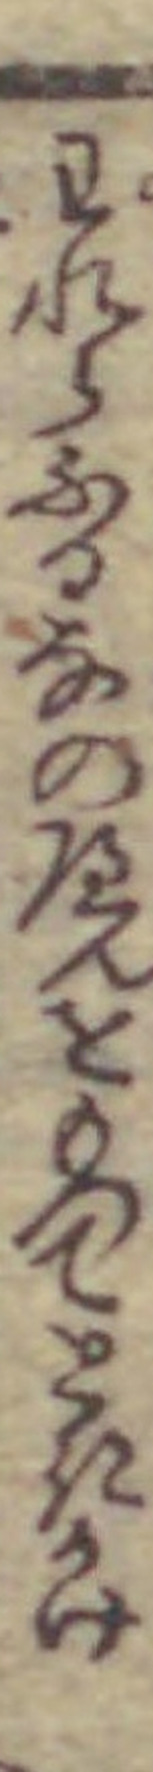われらふるなのへんをもつてときかけ
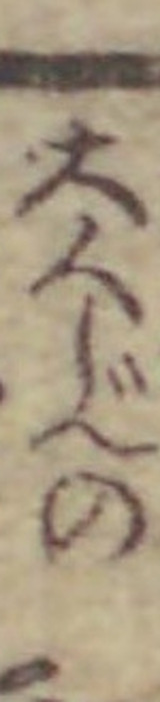大人じんの
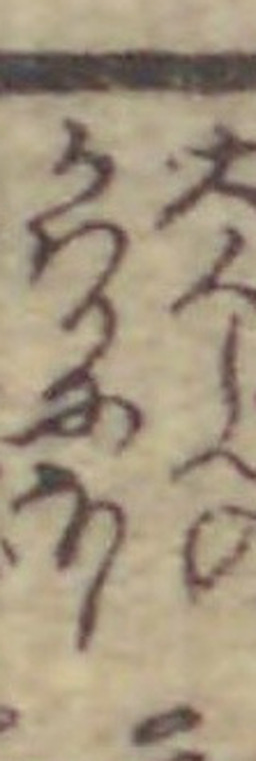かはりにほし
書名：止而道致虚録 3巻
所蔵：国立国会図書館 National Diet Library, JAPAN
